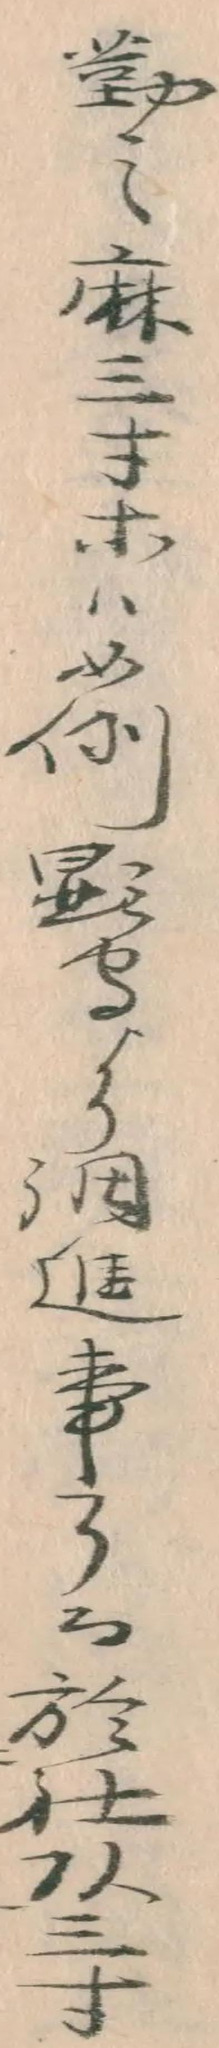勤之麻三寸等ハ如例顕守より調進事了而於社頭三寸
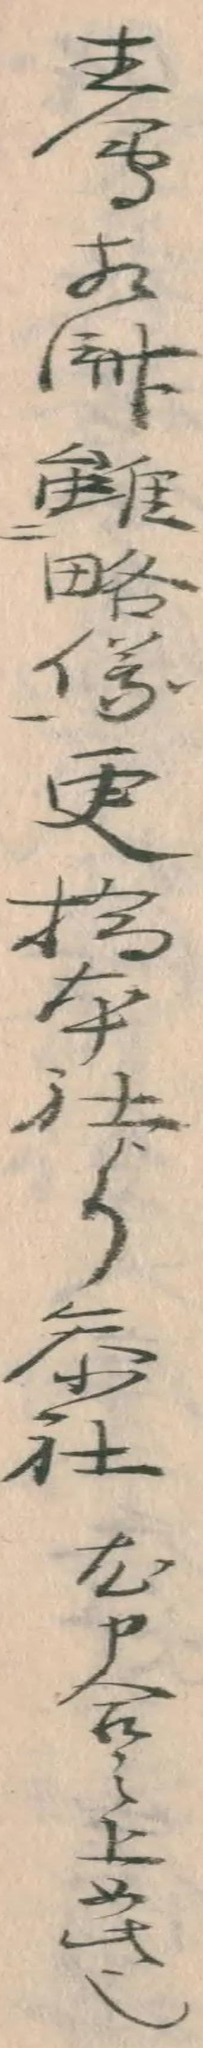直會相済雖略儀更橋本社より参社尤申合之上如此也
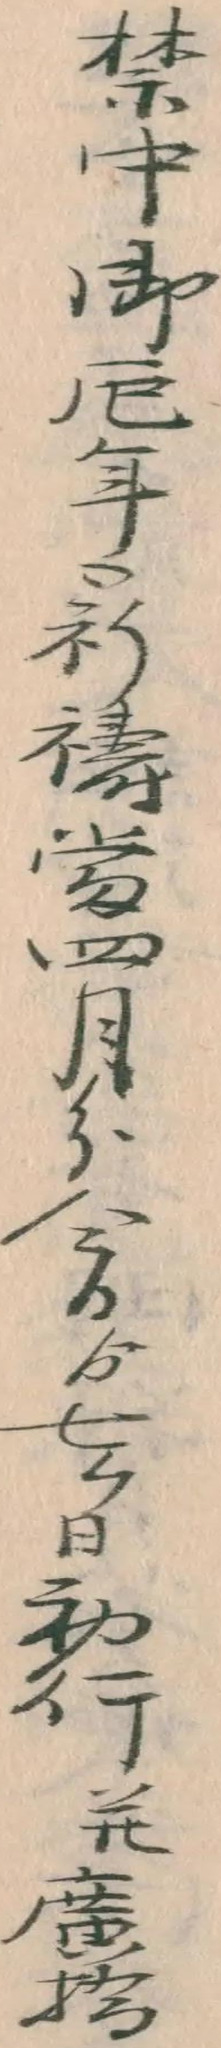禁中御厄年御祈祷當四月分今日ゟ七ケ日勤行并廣橋
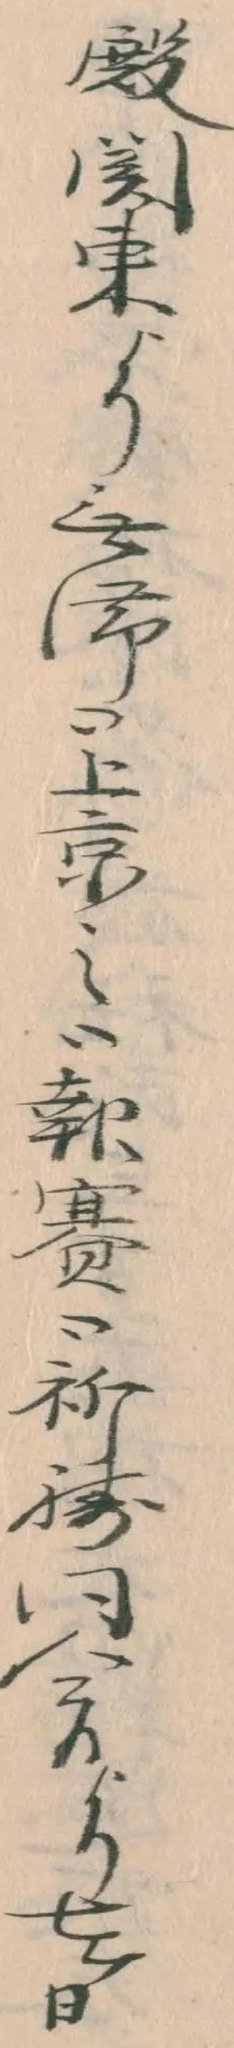殿関東より無滞御上京之御報賽御祈祷同今日より七ケ日
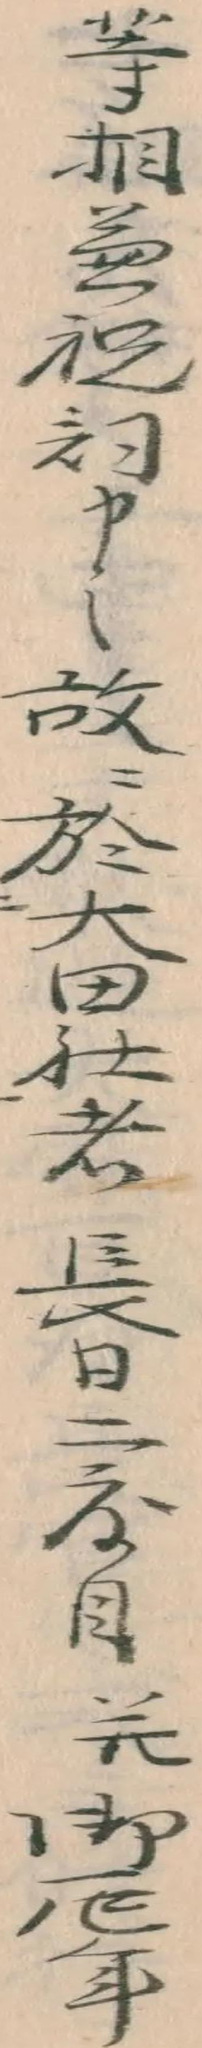等相兼祝詞申之故ニ於大田社者長日二度目幷御厄年
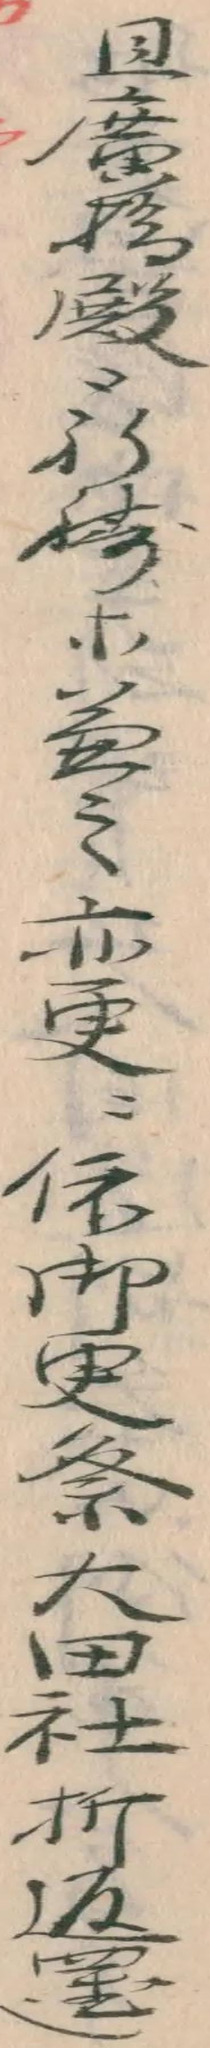且廣橋殿御祈祷等兼之亦更に依御更祭大田社折返置也
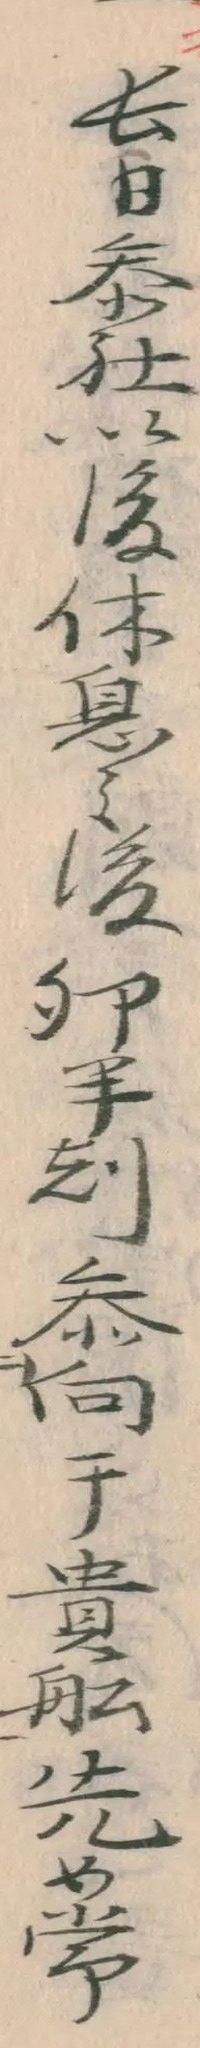一長日参社以後休息之後卯半刻参向于貴船先如常
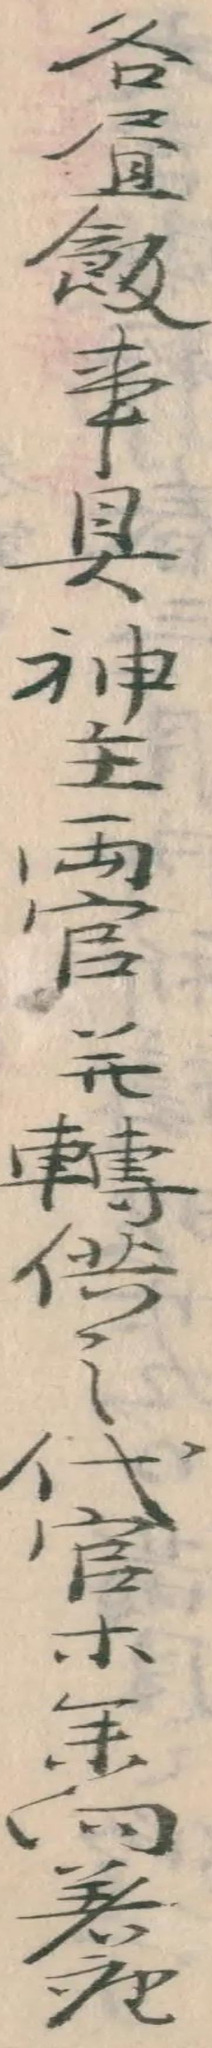各昼飯事具神主両官并轉供之代官等参向着座
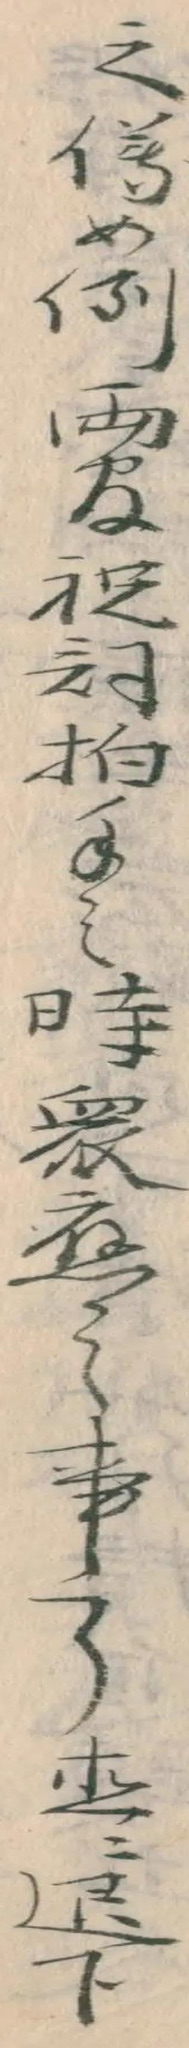之儀如例両官祝詞拍手之時衆應之事了直ニ退下
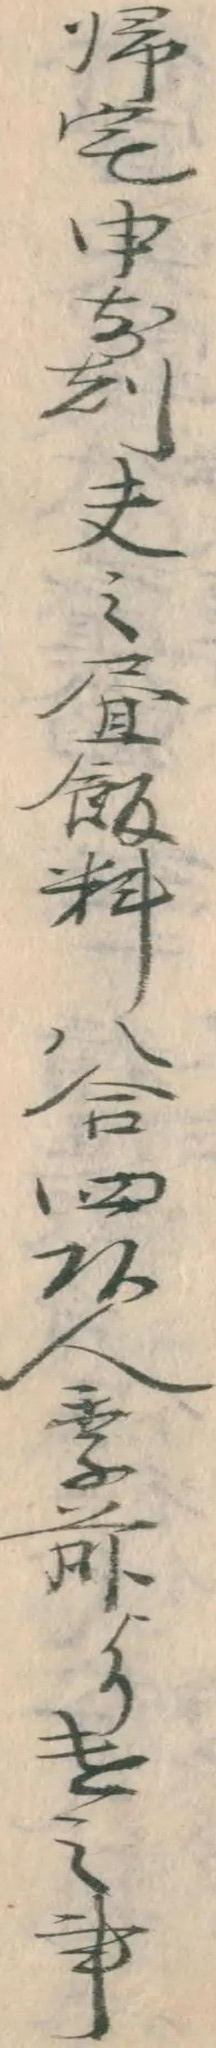帰宅申前刻夫之昼飯料八合四頭人季前より遣之事
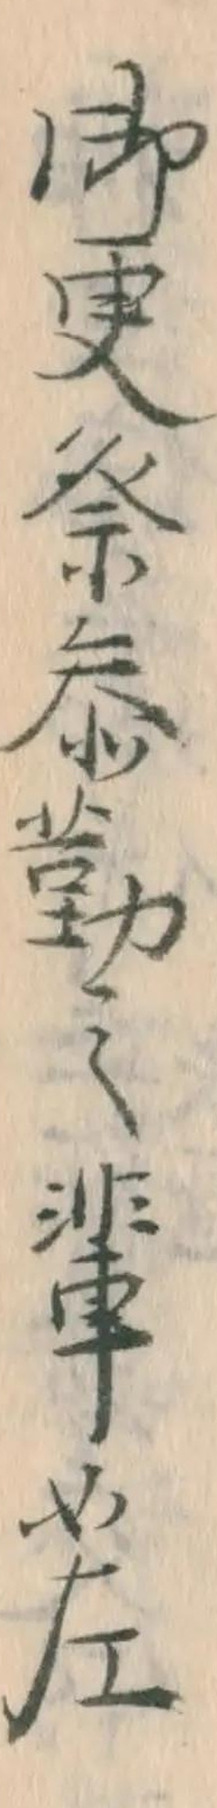御更祭参勤之輩如左

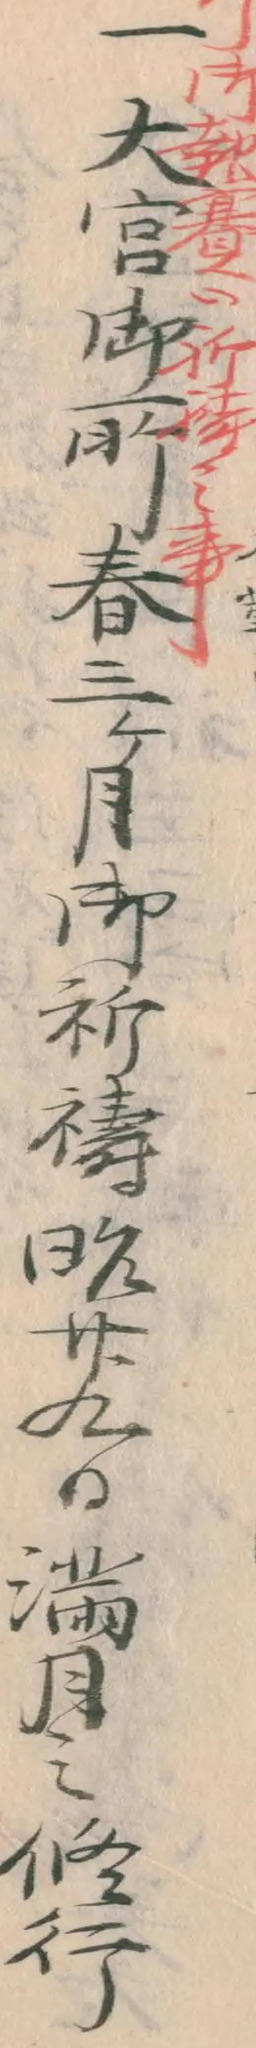一大宮御所春三ケ月御祈祷昨廿九日満月之修行
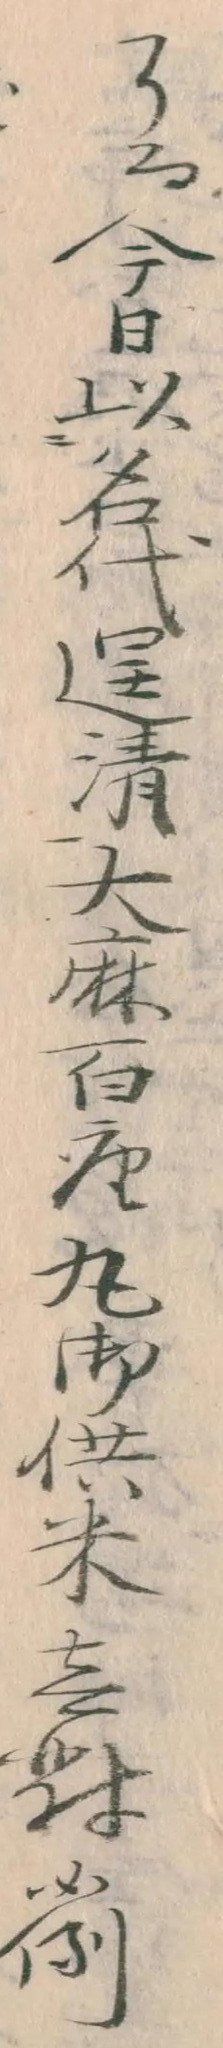了而今日以名代逞清大麻百座丸御供米壱對如例
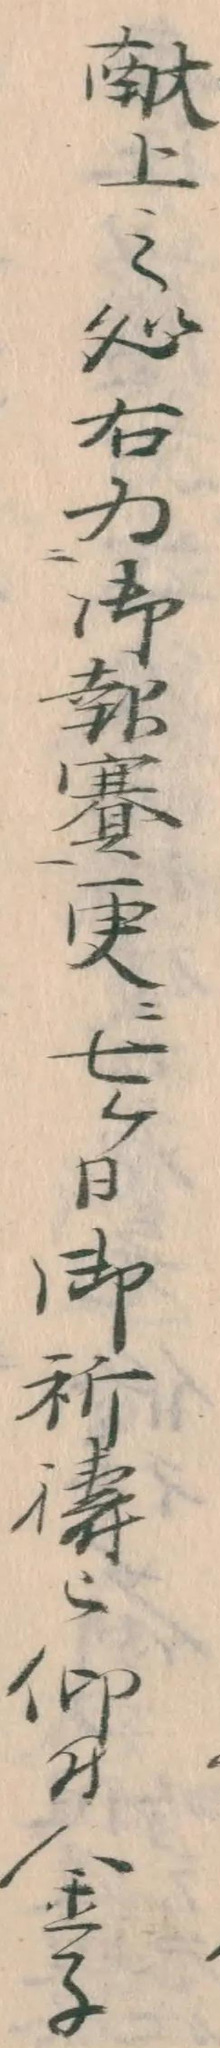献上之処右為御報賽更ニ七ケ日御祈祷被仰付金子
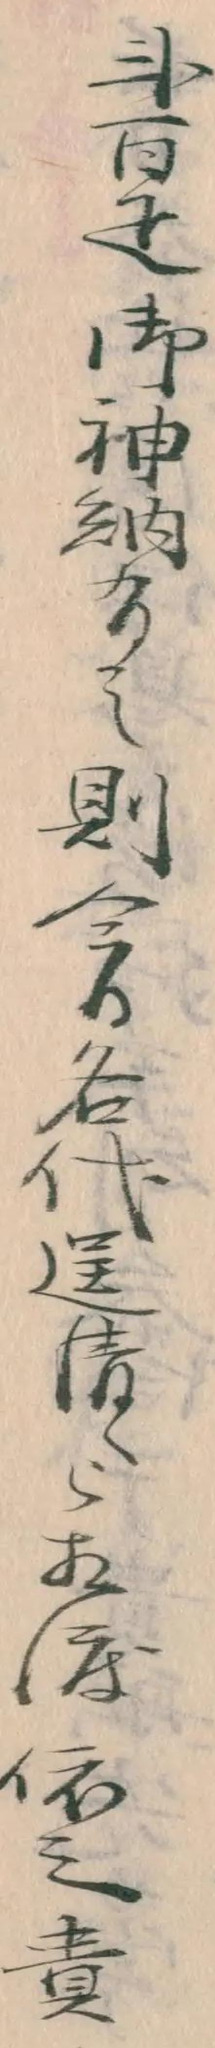弐百疋御神納有之則今日名代逞清へ被相渡依之責
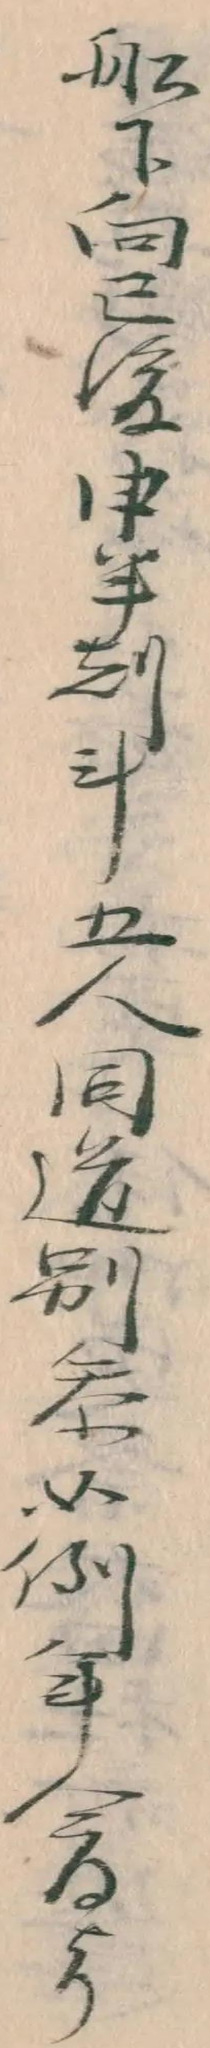船下向已後申半刻斗五人同道別参如例年今日より
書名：賀茂社記録. 第73冊
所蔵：国立国会図書館 National Diet Library, JAPAN
